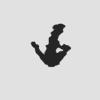出
